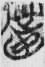○（僕）
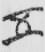五
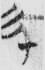帀（師）
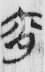宵
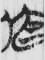倌
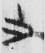之
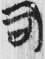司
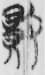敗
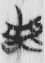若
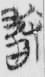敢
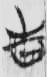告
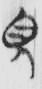視
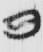日
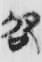卲
